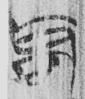○（貽）
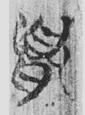○（羞）
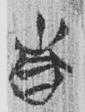青（請）
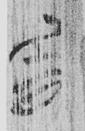昏（問）
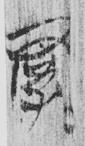君子
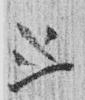之
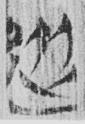從
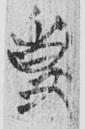事
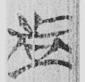者
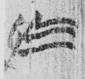於
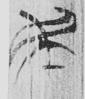民
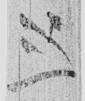之
